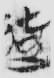适
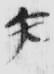內（入）
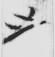之
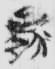○（嬴）
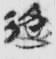○（路）
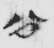公
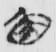角
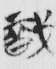戠
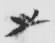之
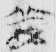義
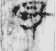○（得）
